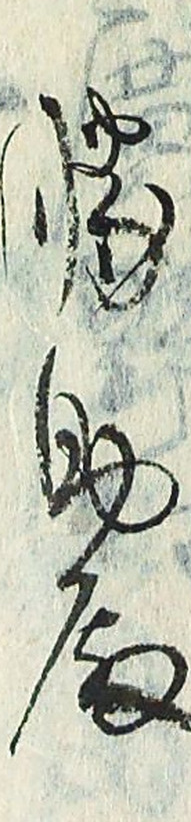勝助殿
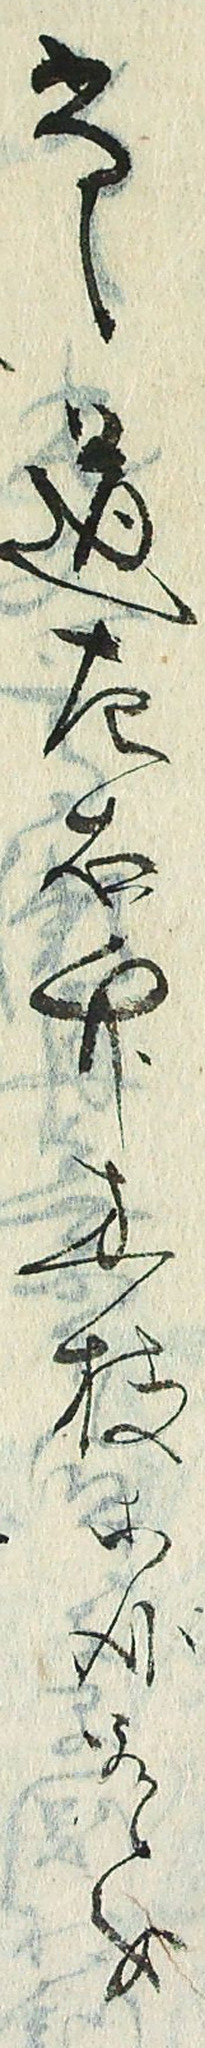尚々道左右竹木枝等刈取候義
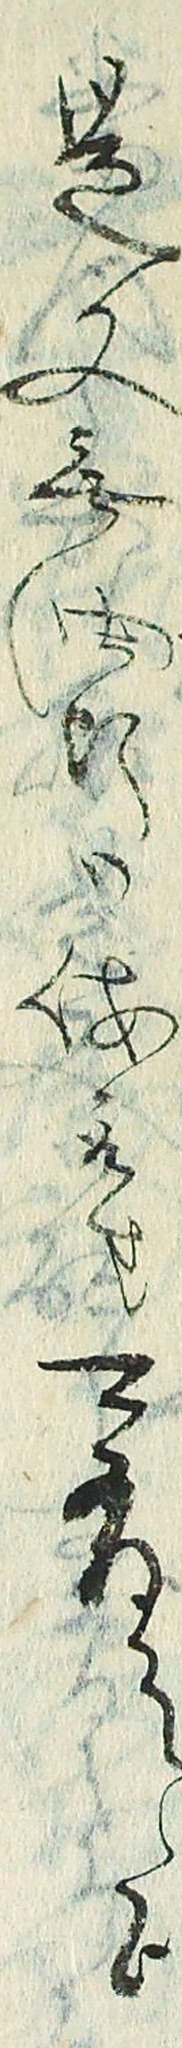是又無油断御伐取せ可有之候以上
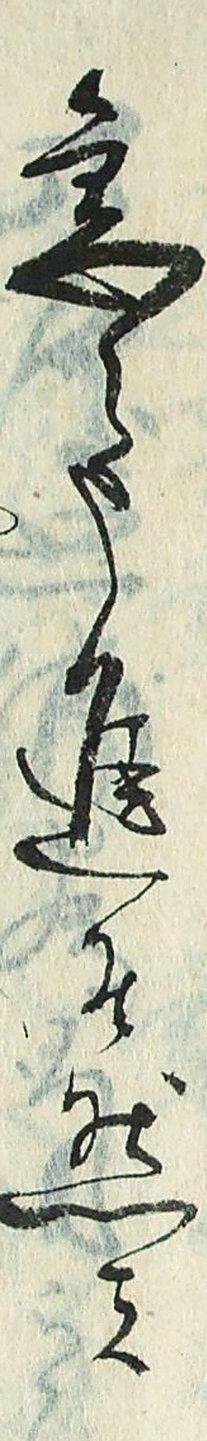急々申進候然は
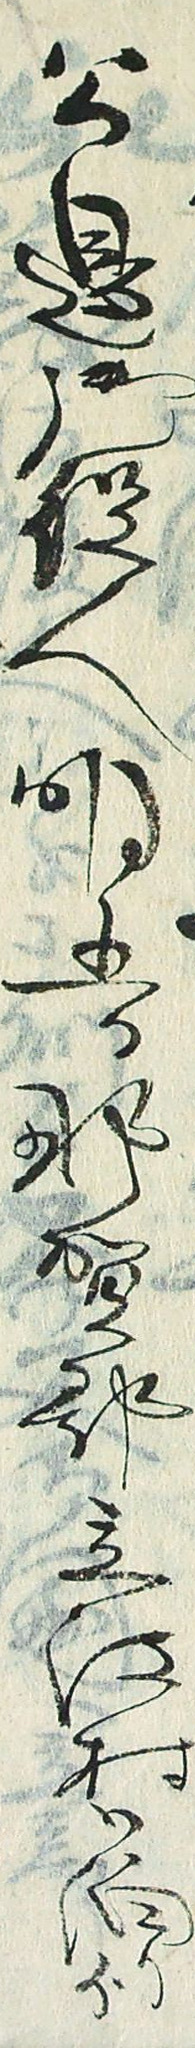公辺御役人明五日那賀郡立江村御泊りゟ
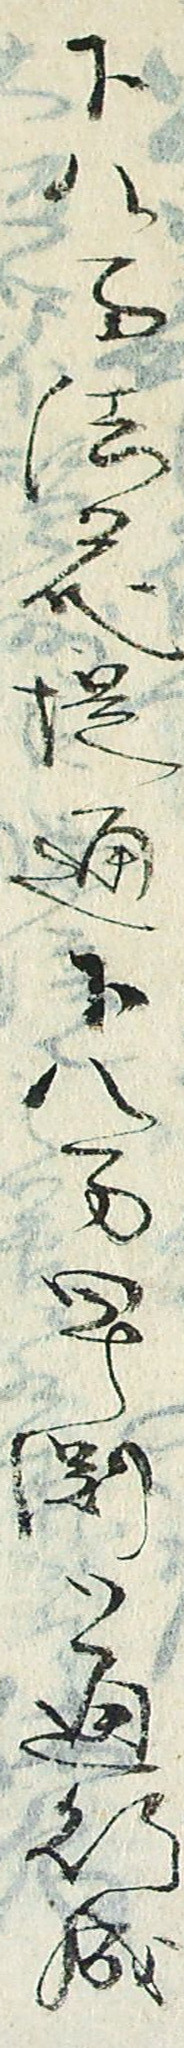下八万法花堤通下八万早淵御通行成
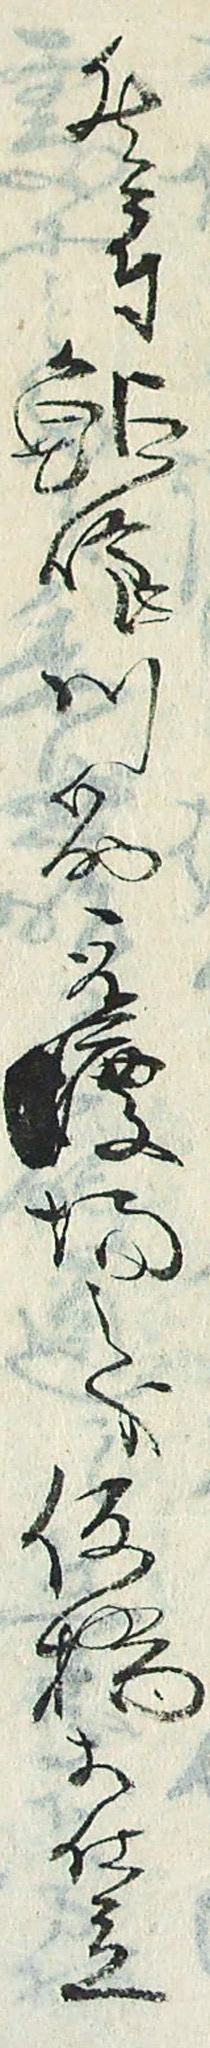候に付鮎喰川筋取渡場之義仮橋相仕立

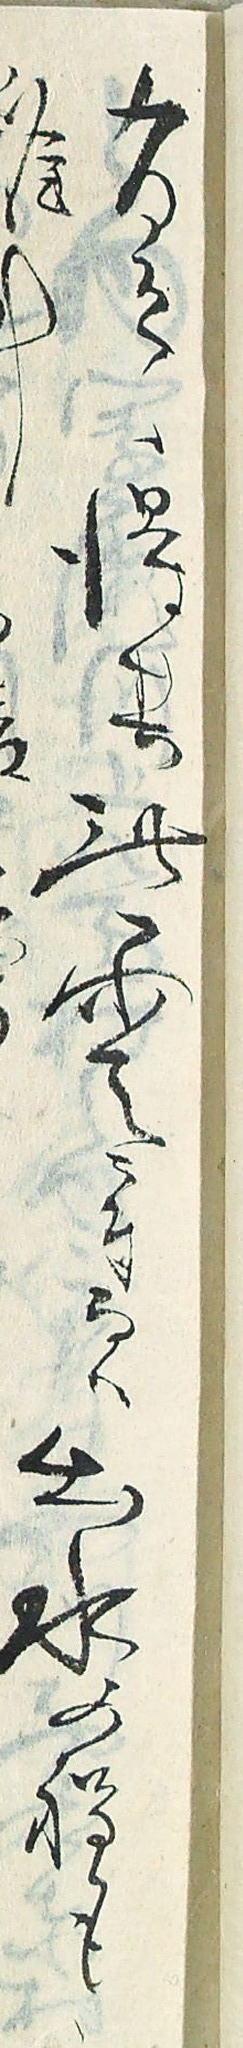有之候得共此雨天に付ては出水の程も
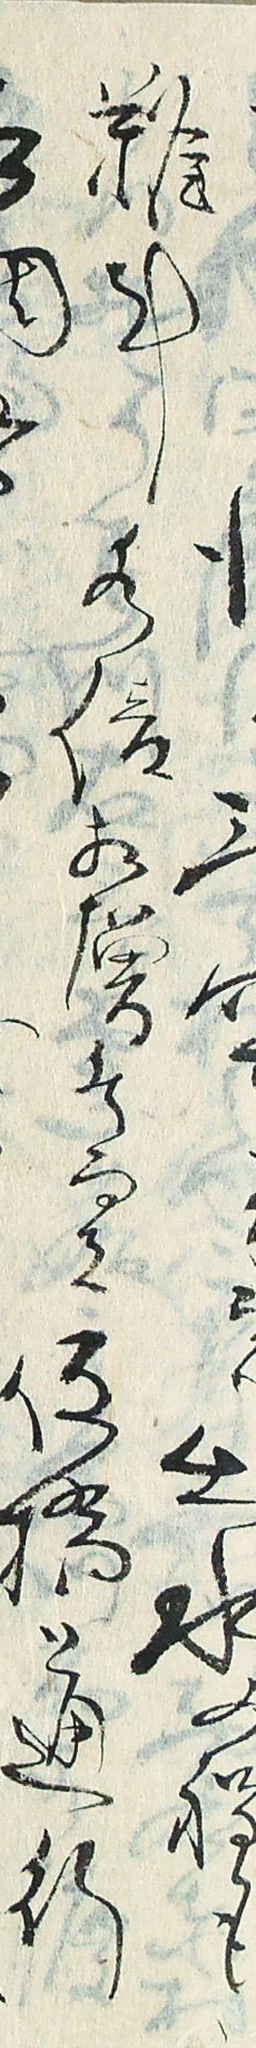難計水位相増候ては仮橋御通行
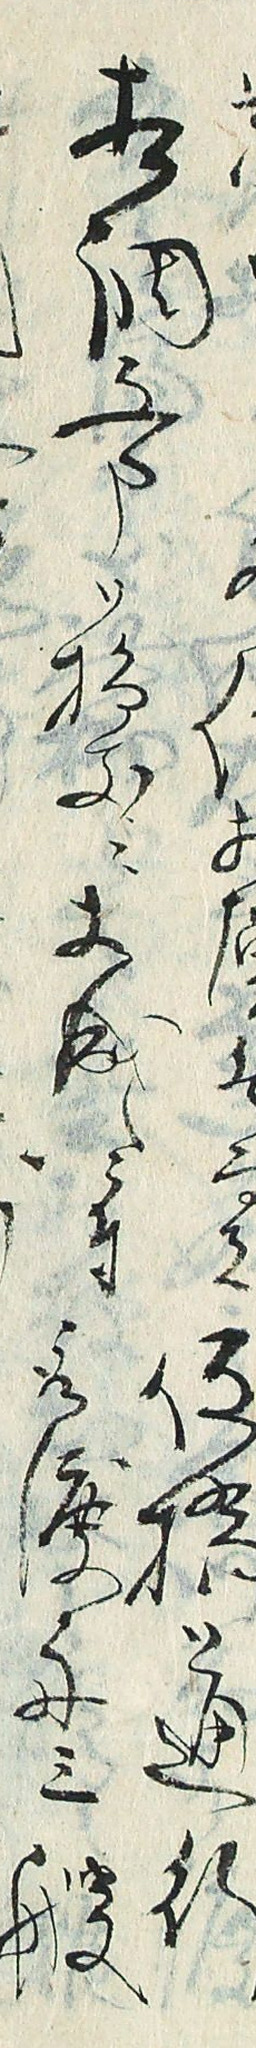相調不申御指支に相成候に付取渡舟三艘
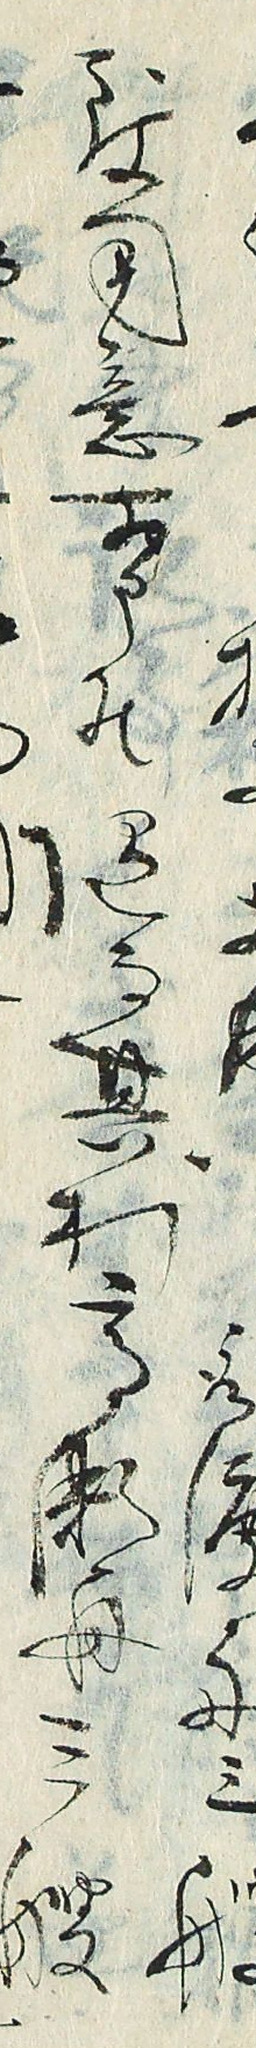致用意可申候随て其村高瀬舟三艘
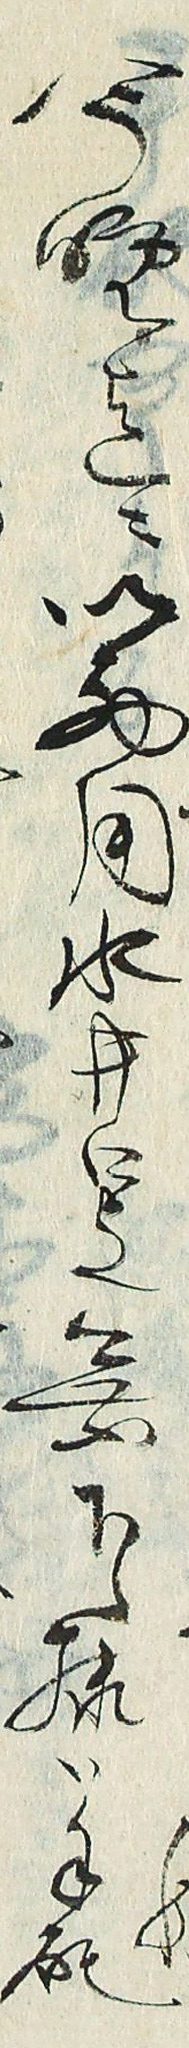今晩迄に以西用水井口迄乗下候様御手配
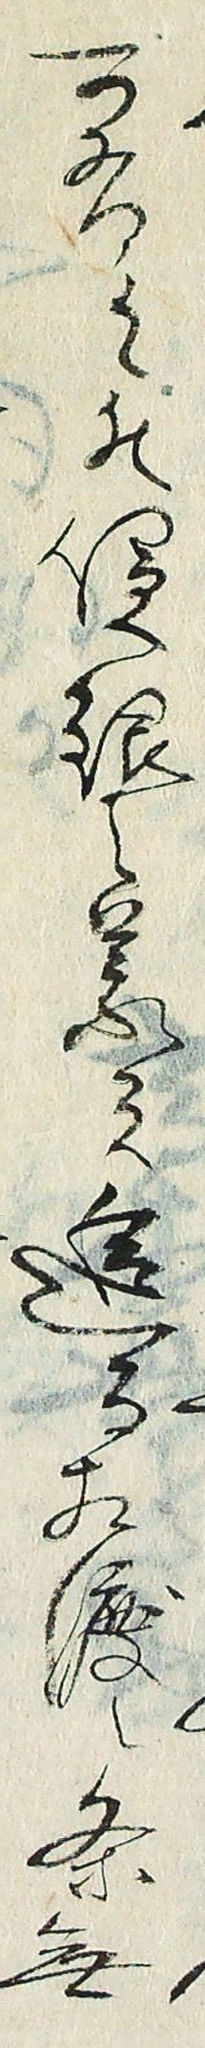可有之候賃金之義は追て相渡候条無
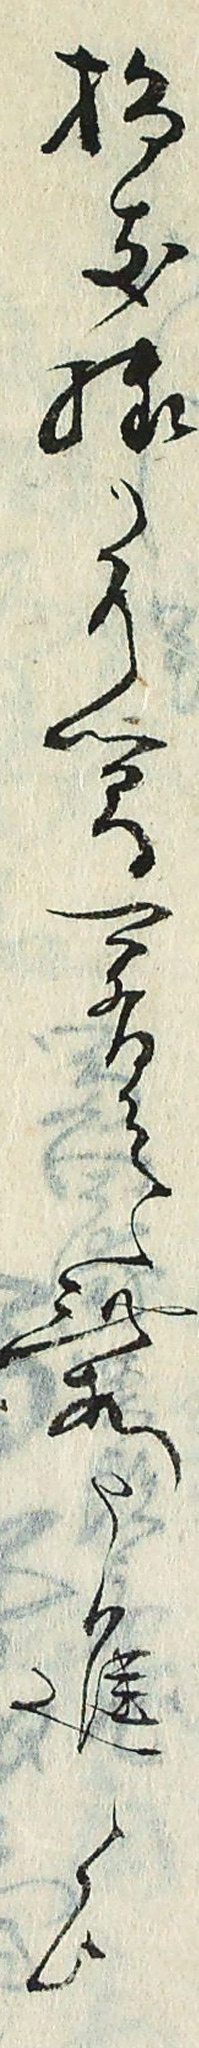指支様御了簡可有之候此段申候以上
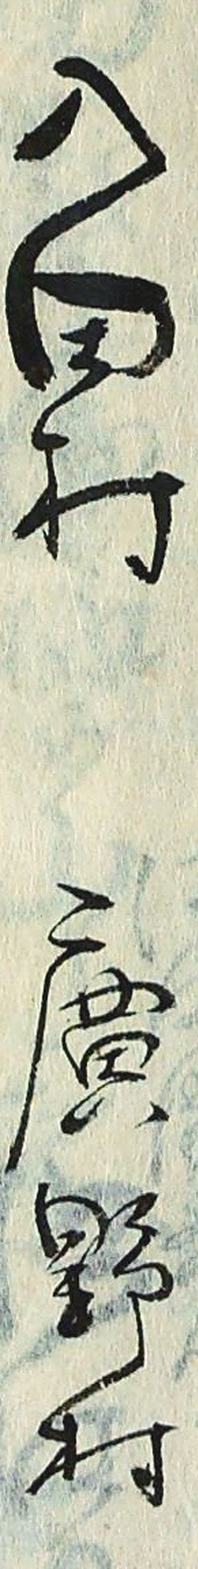入田村広野村
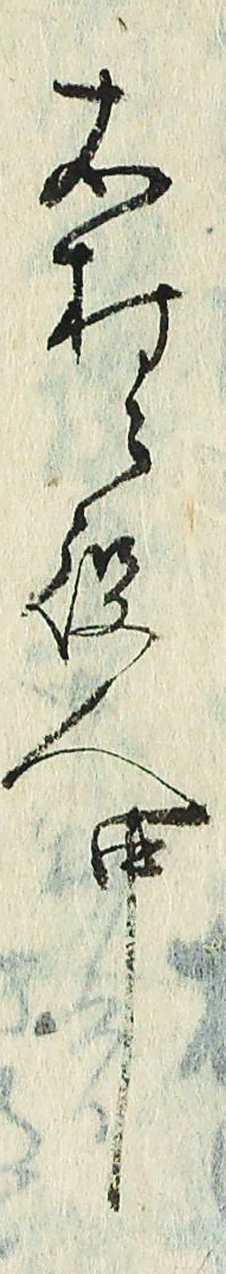右村々役人中
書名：公辺御役人為御廻浦御立越諸御用一巻
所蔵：鳴門教育大学 Naruto University of Education
